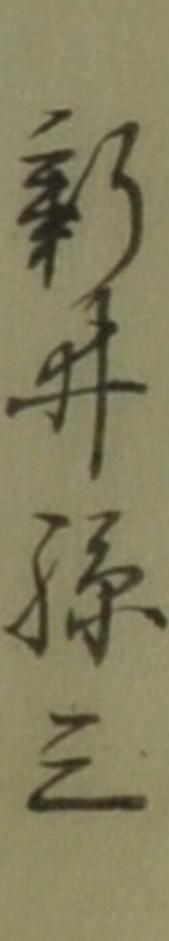新井孫三
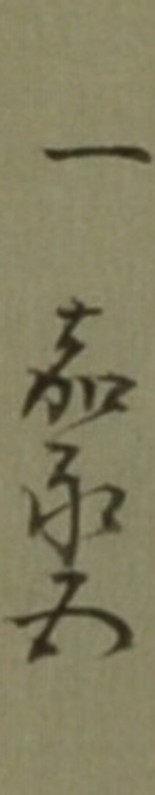一嘉永五
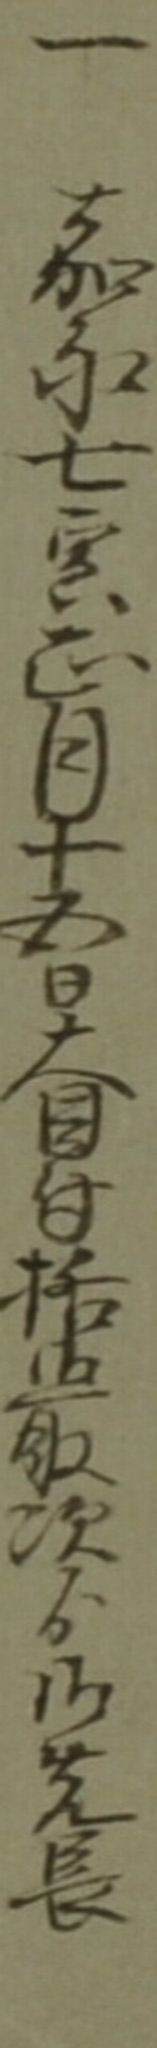一嘉永七寅正月十五日大目付格御取次ゟ御先長
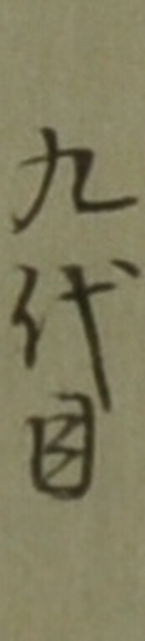九代目
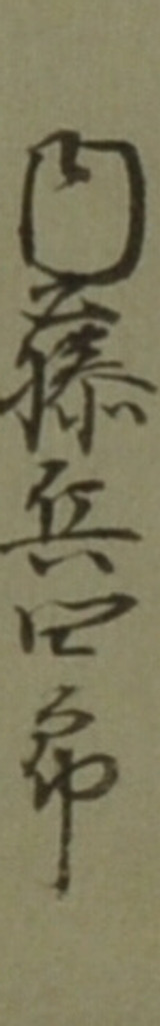内藤兵四郎
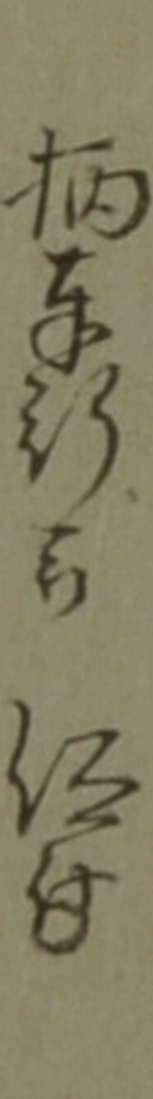長柄奉行被仰付

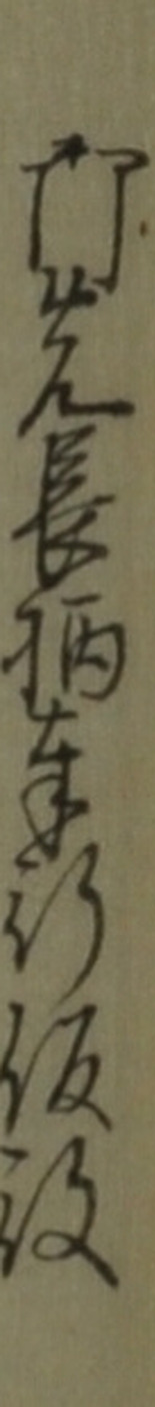御先長柄奉行仮役
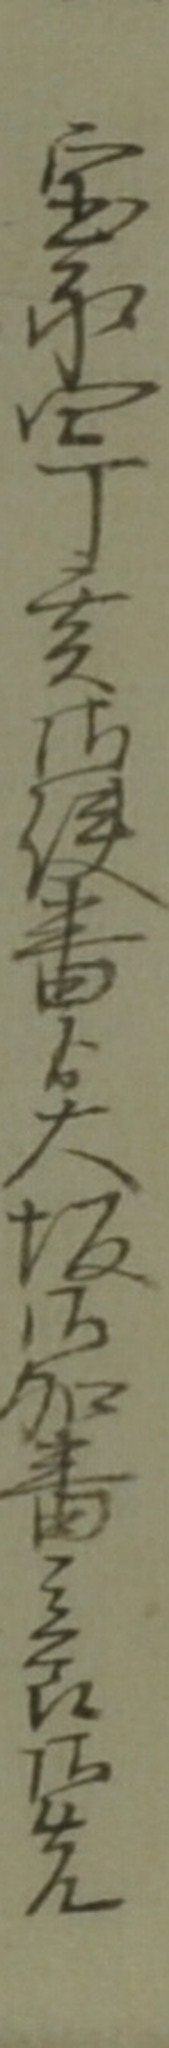一宝永四丁亥御使番ゟ大坂御加番之節御先
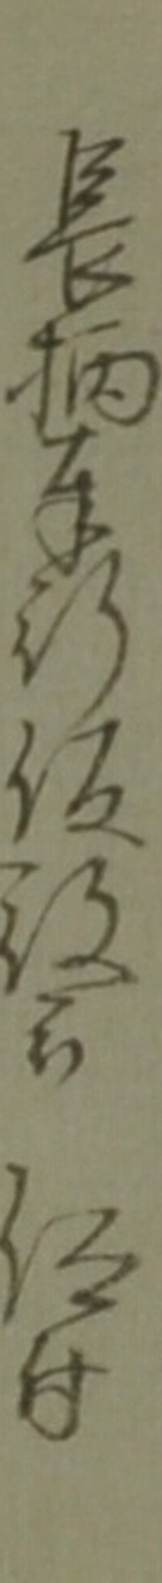長柄奉行仮役被仰付
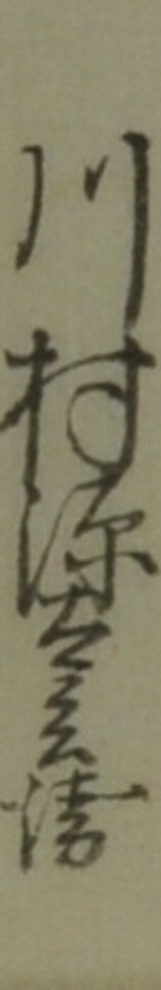川村源太兵衛
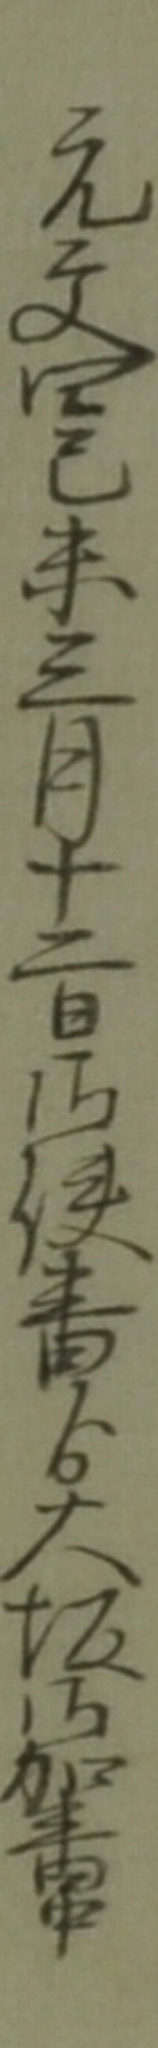一元文四己未三月十二日御使番ゟ大坂御加番中
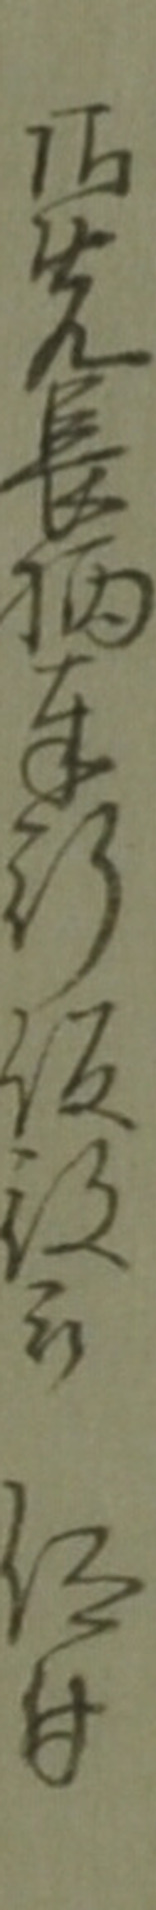御先長柄奉行仮役被仰付
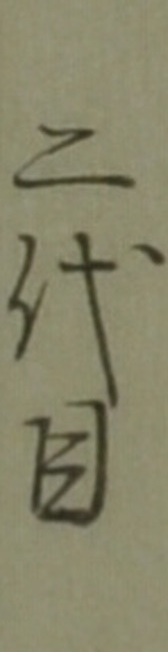二代目
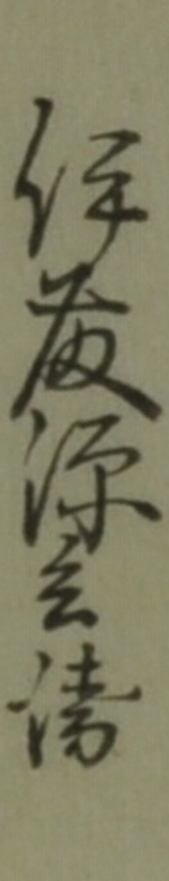伊藤源兵衛
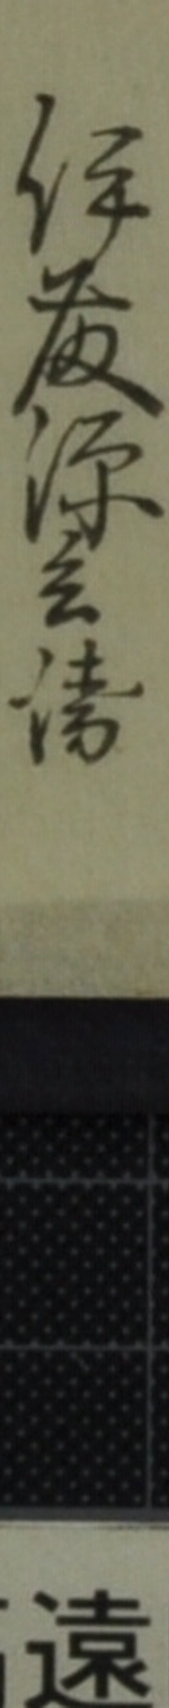伊藤源兵衛

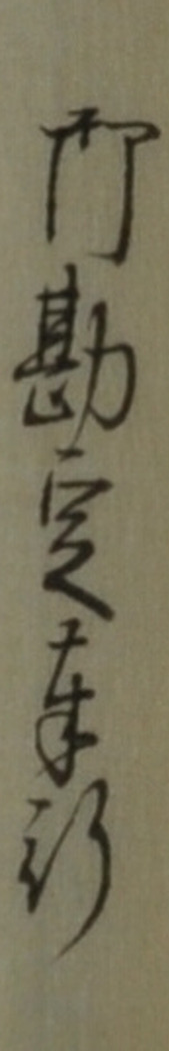御勘定奉行
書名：諸御役代々録（三）
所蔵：伊那市立高遠町図書館・合同会社AMANE
